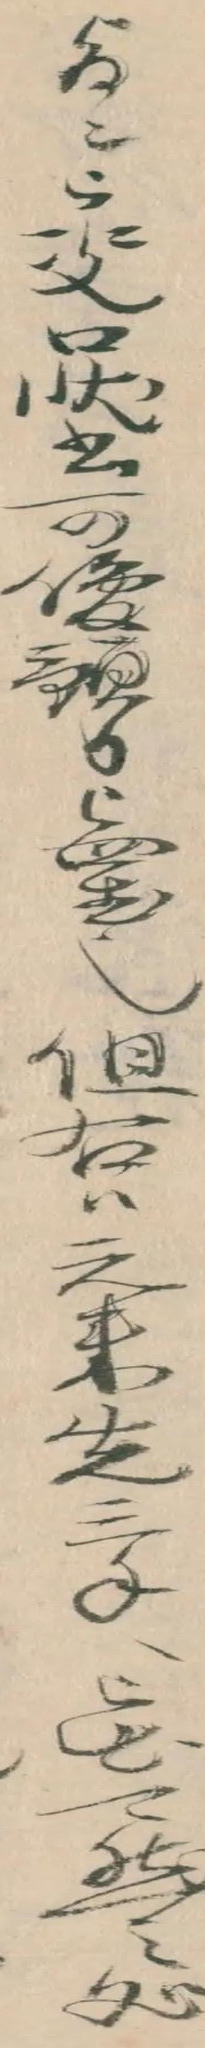旨ニ而決口状書可被置也但右ハ元来先三手へ被出可然之処
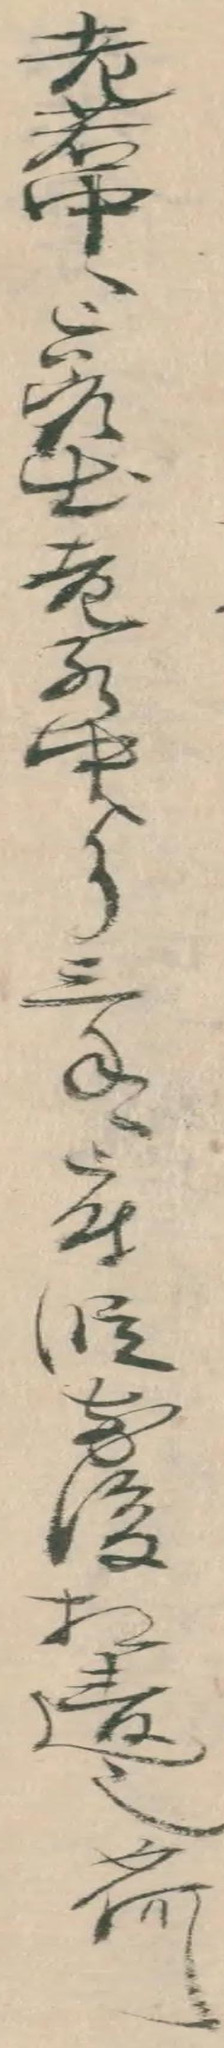老若中へ被差出老若中より三手へ被付段前後相違也如例
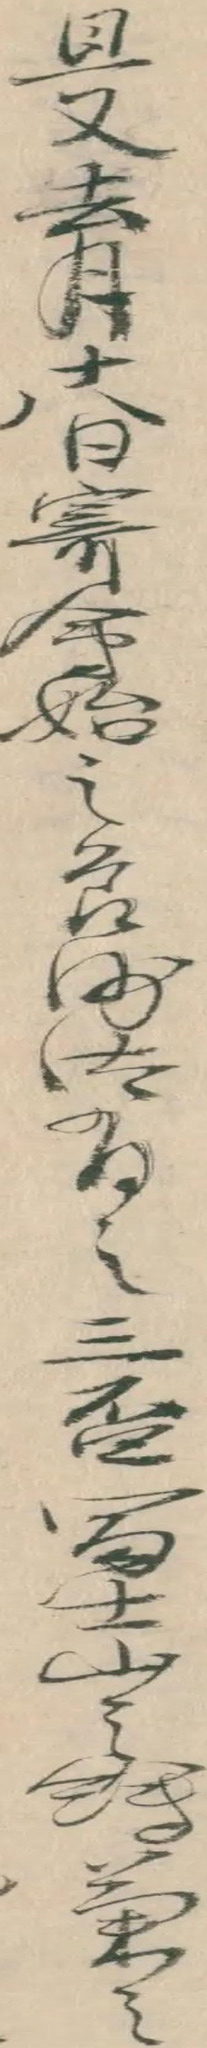且又去月十八日寄合始之節沙汰有之三盃富士山之繪兼菊之
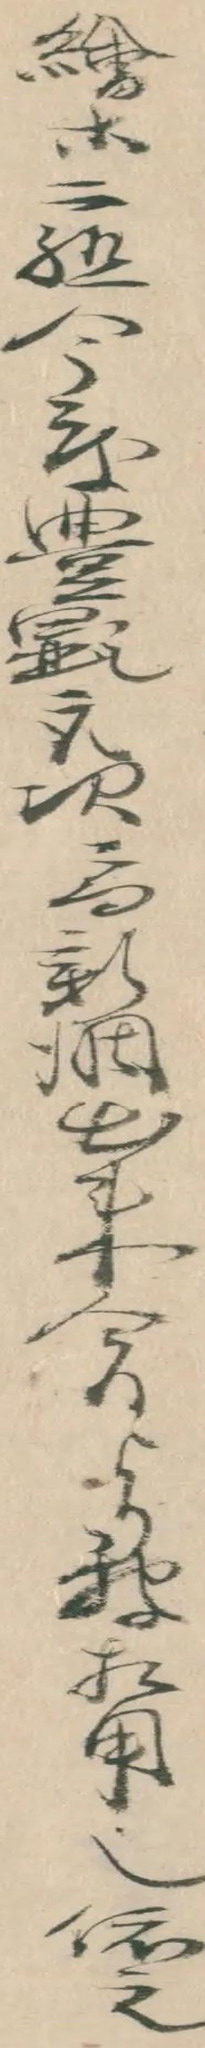繪等二組今度豊顕取次二而新調出来今日より被相用也依之
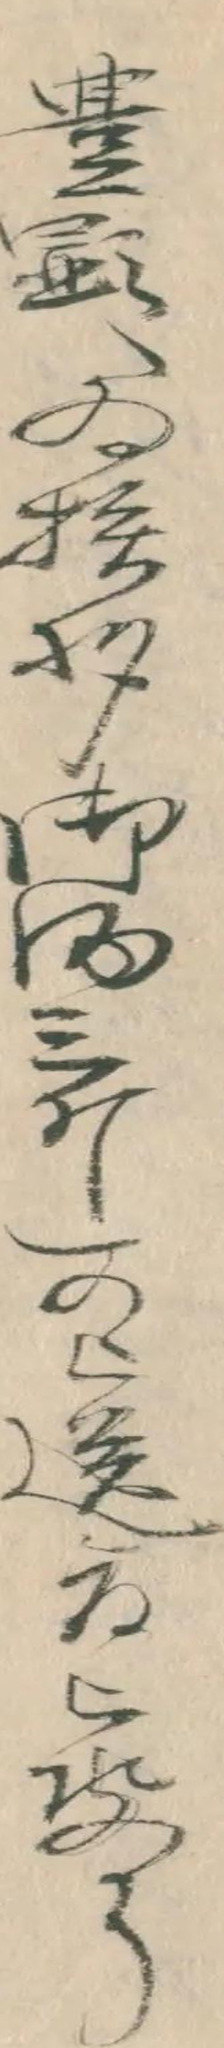豊顕へ為挨拶御酒三升可被送旨被決了
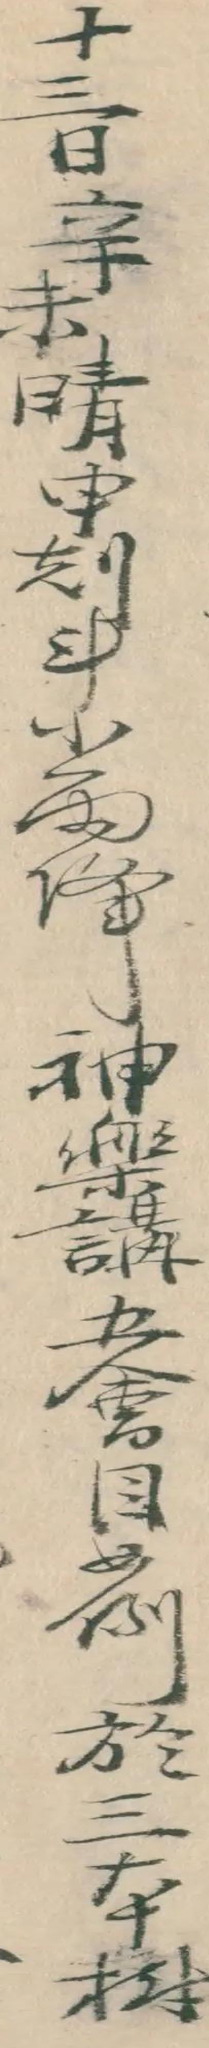十三日辛未晴申刻斗小雨降神楽講五會目如例於三本掛
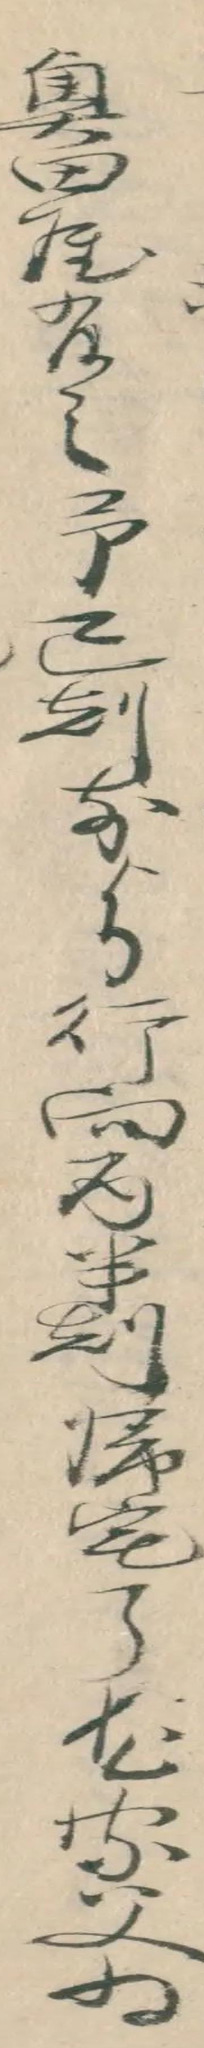奥田屋有之予巳刻前より行向酉半刻帰宅了尤家父為
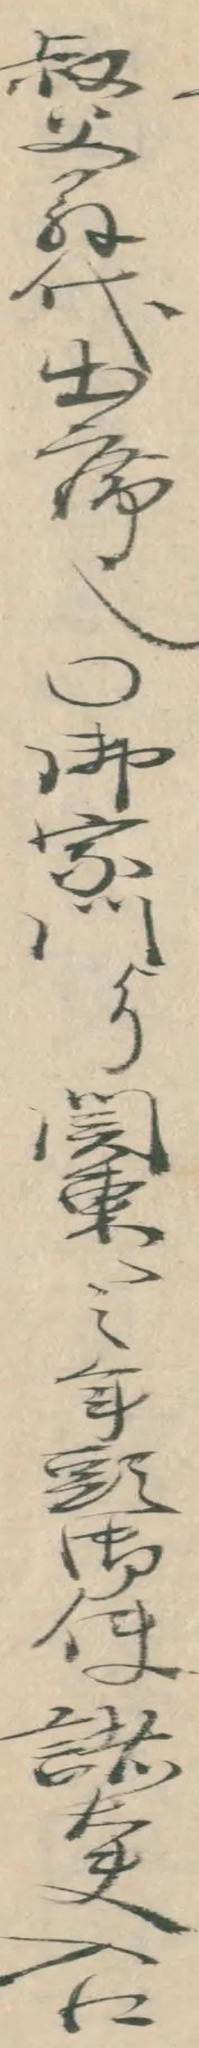叔父翁代出席也〇御家門より関東へ之年頭御使諸大夫入口
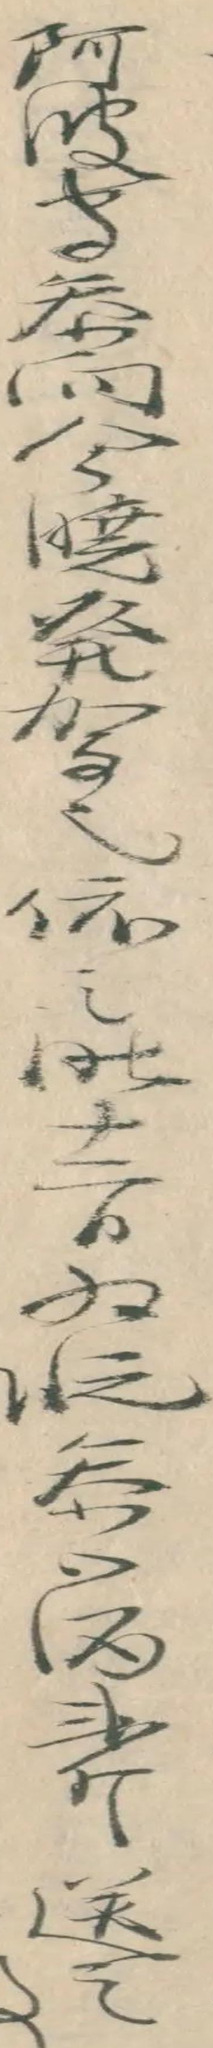阿波守参向今暁発駕也依之昨十二日為従参御酒弐升送之事
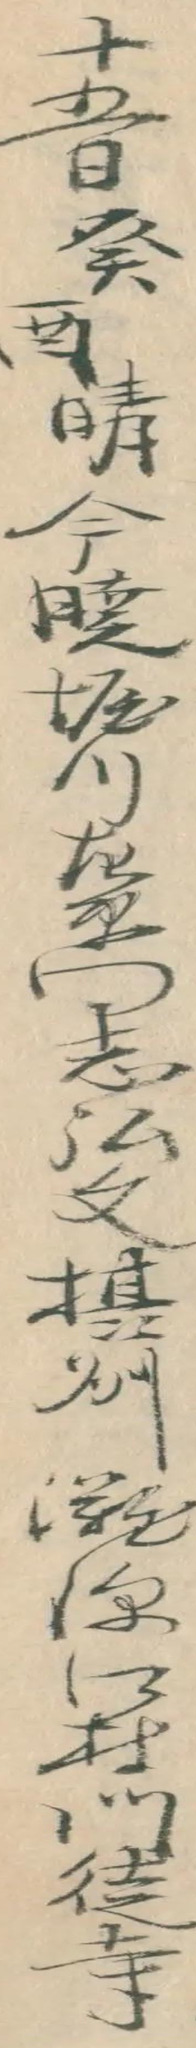十五日癸酉晴今暁堀川左衛門志弘文摂州灘深江村門徒寺

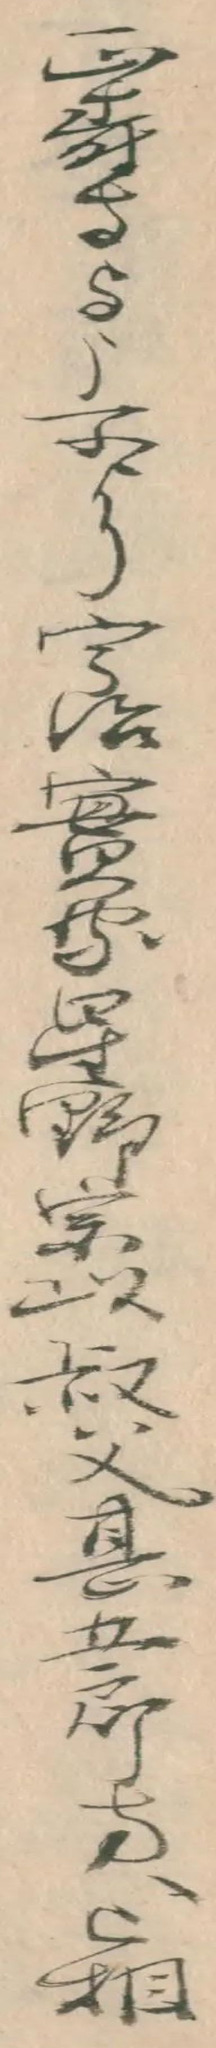正壽寺と申所より宇治實家星野宗以叔父甚五郎方へ被相
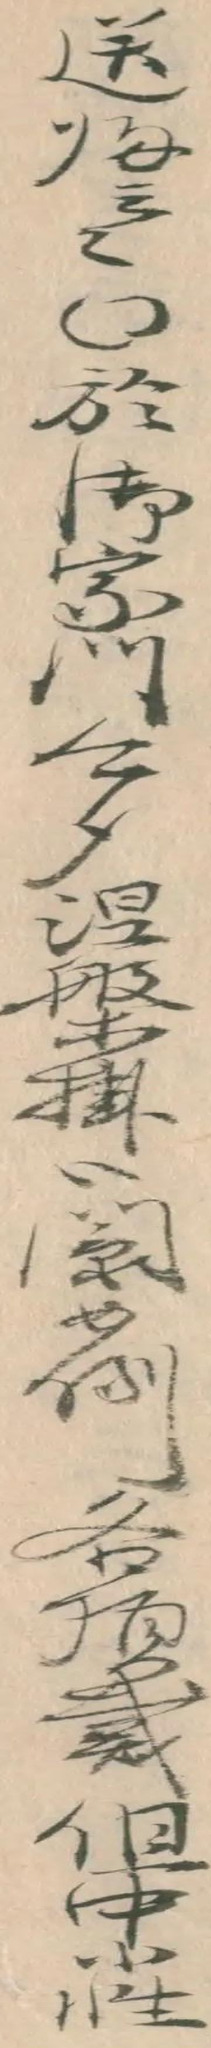送帰云〻○於御家門今夕涅槃掛御鬮如例各頂戴但中小姓
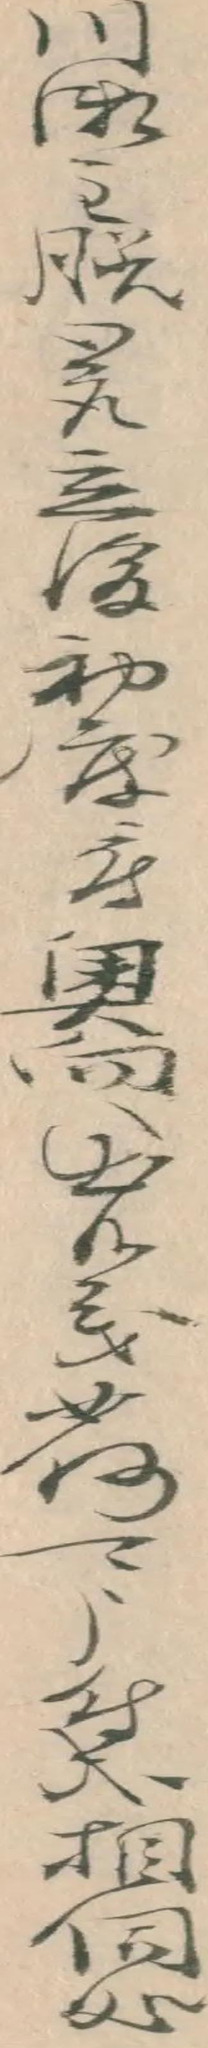川瀬主膳御取立後初度ニ付奥向へ出候義如何可申付哉相伺処
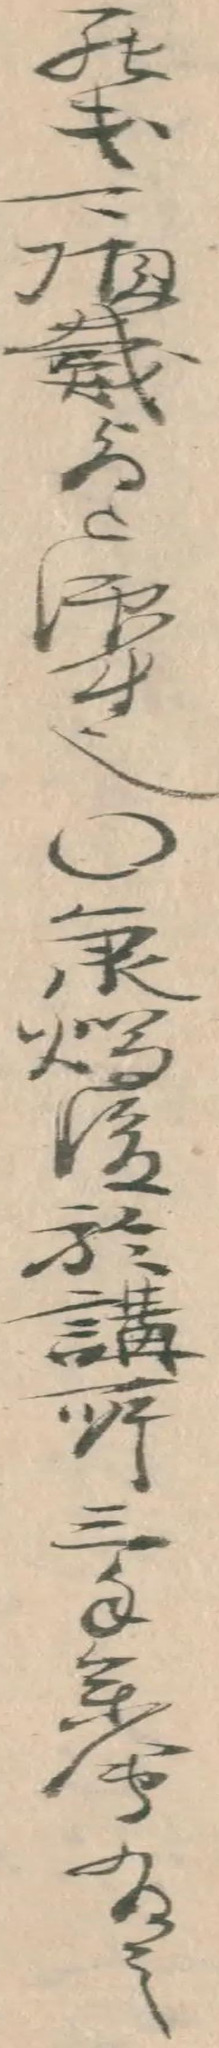罷出可頂戴旨被仰付也○秉燭後於講所三手参會有之
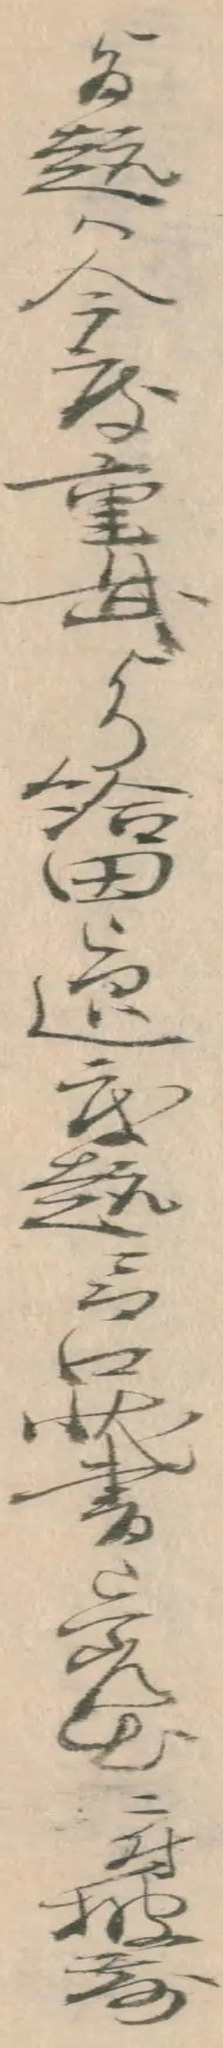旨趣ハ今度重武より給田被過度趣ニ而口状書被差出ニ付披露
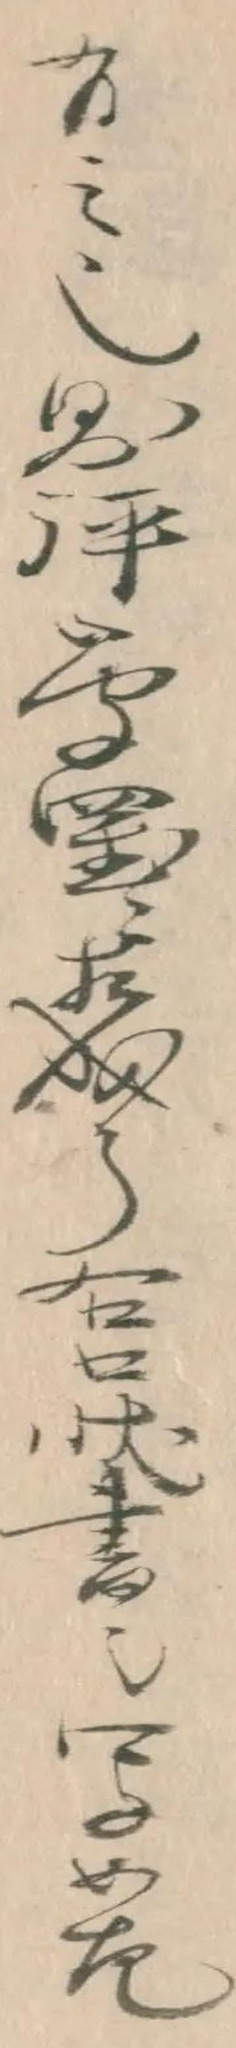有之也則評御聞置ニ相成了右口状書之写如左
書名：賀茂社記録. 第65冊
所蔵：国立国会図書館 National Diet Library, JAPAN
